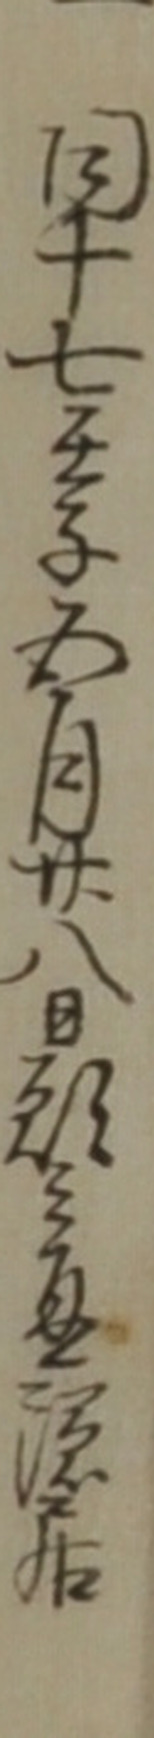一同十七壬子五月廿八日願之通隠居
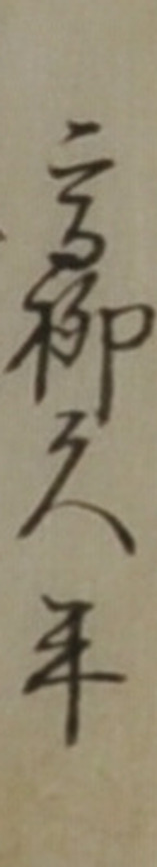高柳久平
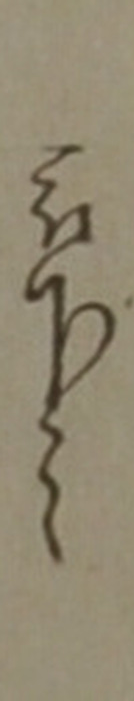被下之
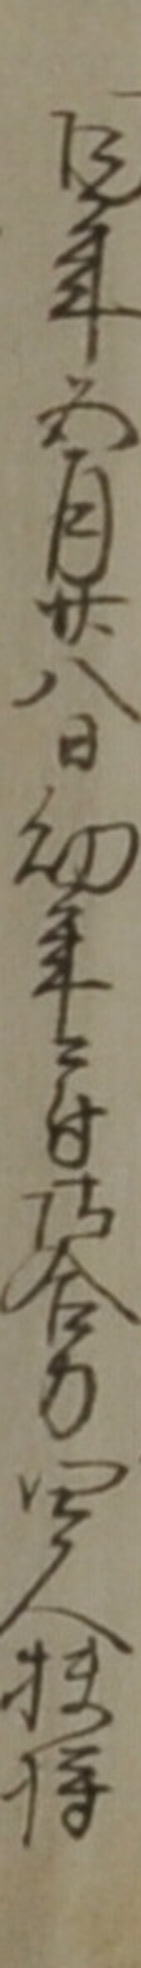一同年五月廿八日幼年ニ付御合力四人扶持
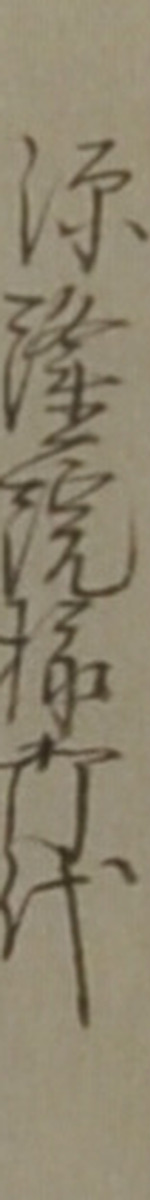源隆院様御代
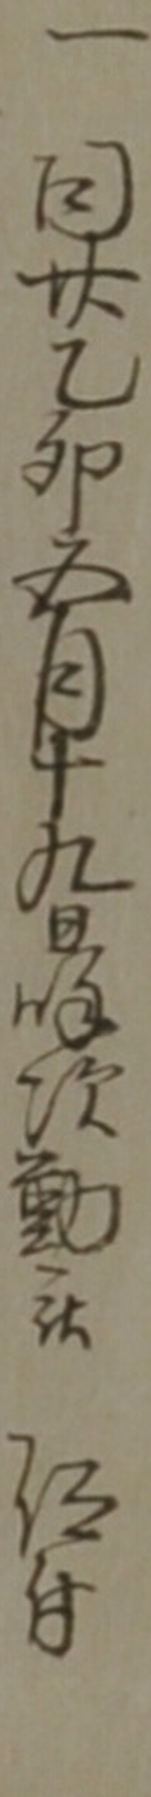一同廿乙卯五月十九日呼次勤被仰付
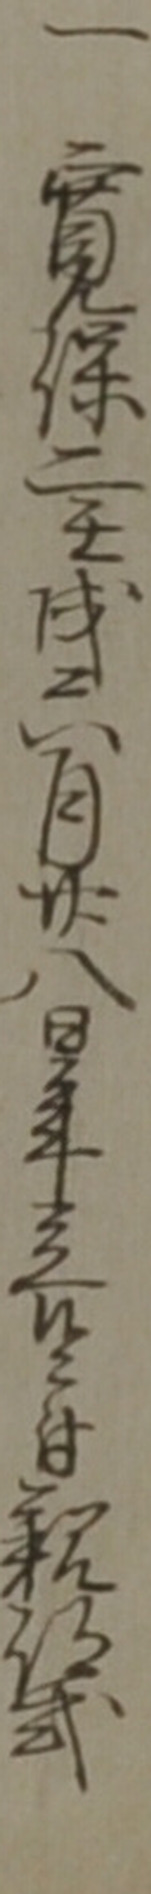一寛保二壬戌六月廿八日年立候ニ付親跡式
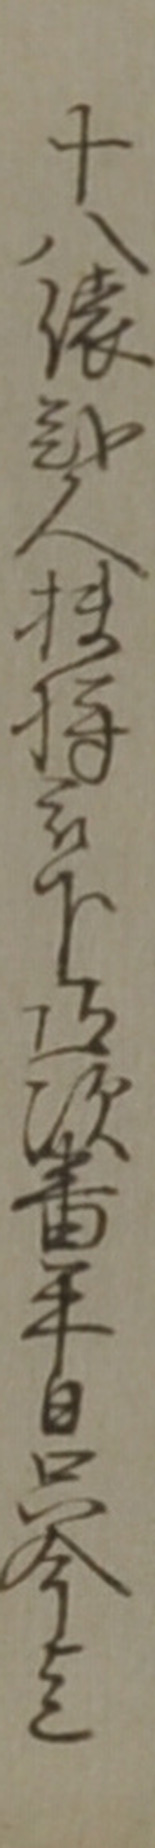十八俵弐人扶持被下御次番平日只今迄
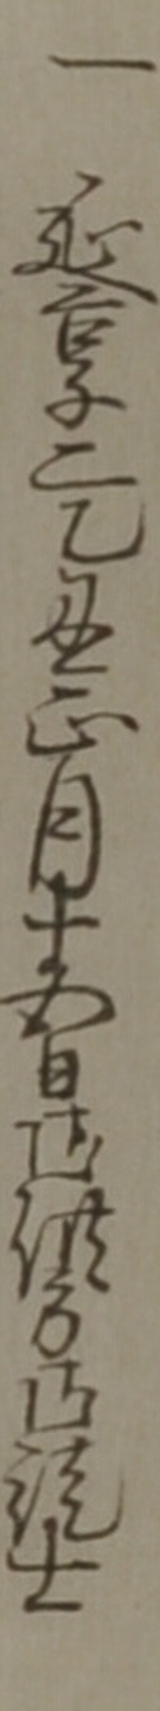一延享二乙丑正月十五日御供方御徒士
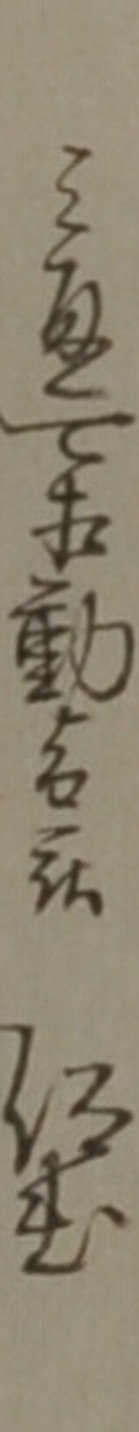之通可相勤旨被仰出
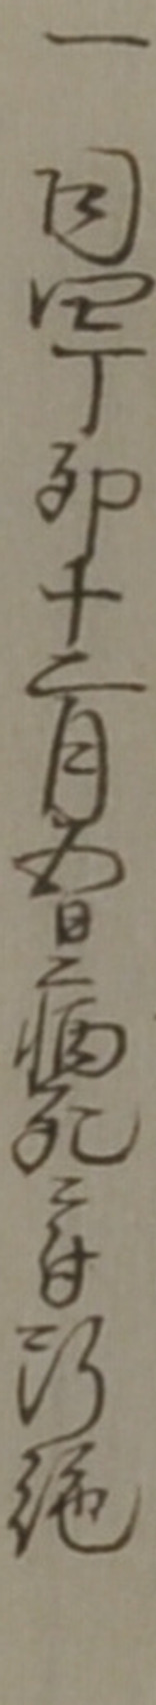一同四丁卯十二月五日病死ニ付断絶
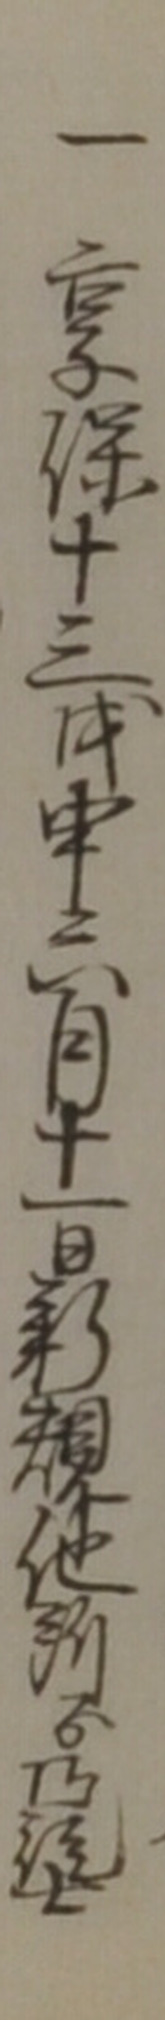一享保十三戊申六月十一日新規他所ゟ御徒士
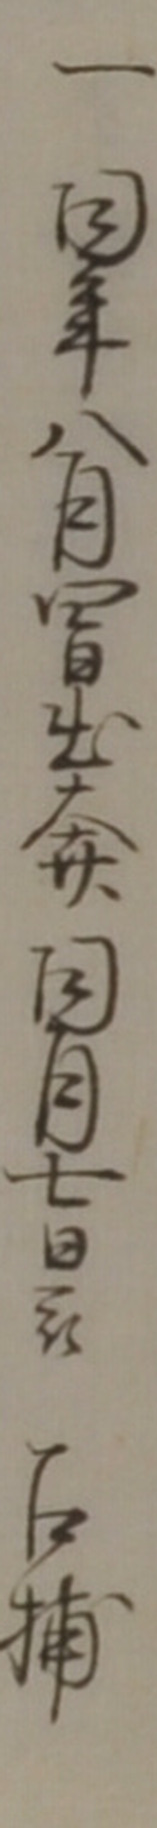一同年八月四日出奔同月七日被召捕
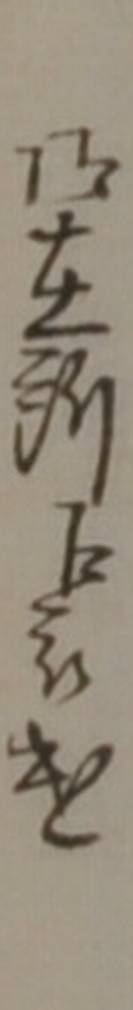御在所江被遣
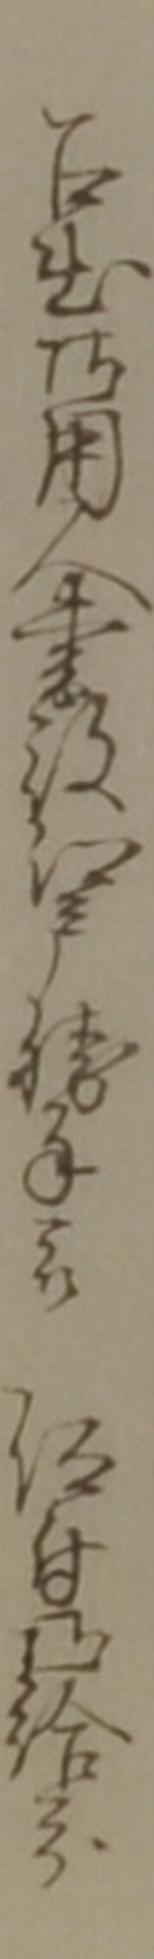召出御用人書役江戸勝手被仰付御給分
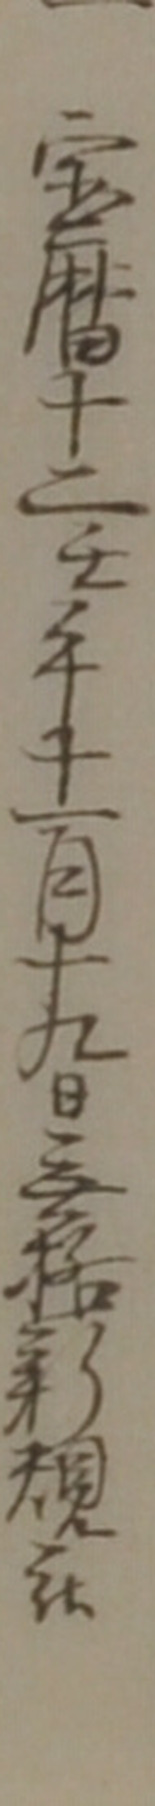一宝暦十二壬午十一月十九日無格新規被
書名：無足廃家（壱）
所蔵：伊那市立高遠町図書館・合同会社AMANE
